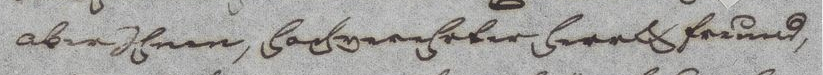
aber Ihnen, hochverehrter Herr & Freund,
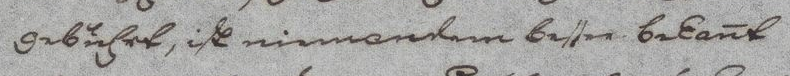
gebührt, ist niemandem besser bekannt
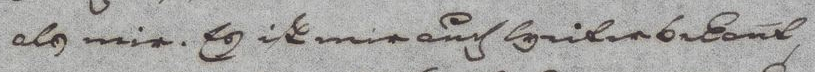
als mir. Es ist mir auch weiter bekannt,
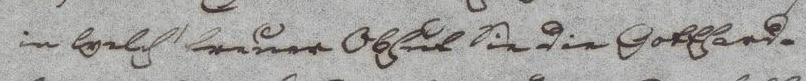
in welch' treuer Obhut Sie die Gotthard -
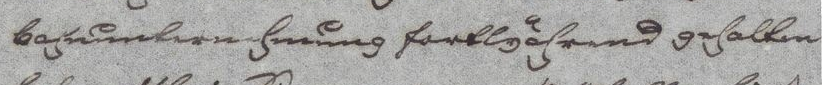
bahnunternehmung fortwährend gehalten
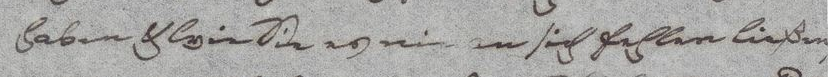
haben, & wie Sie es nie an sich fehlen ließen,
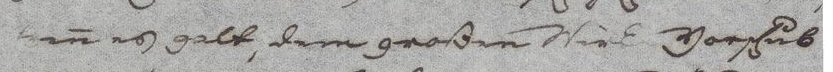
wenn es galt, dem großen Werke Vorschub
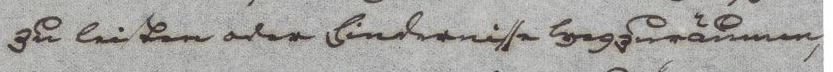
zu leisten oder Hindernisse wegzuräumen,
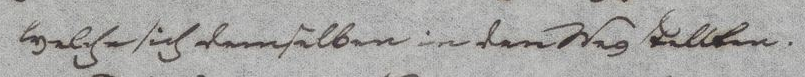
welche sich demselben in den Weg stellten.
